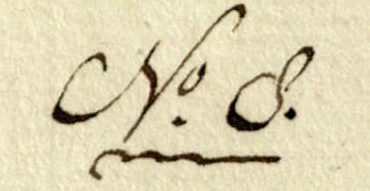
Nº 8.
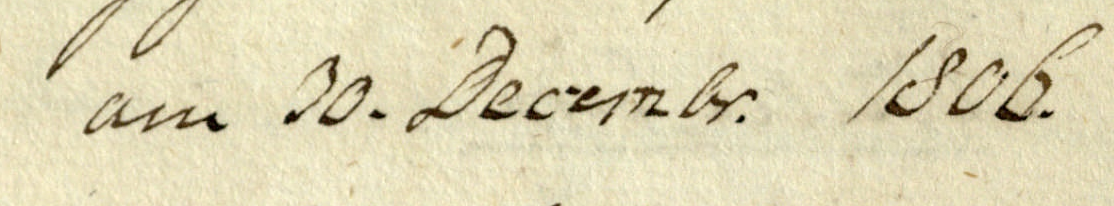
am 30. Decembr. 1806.
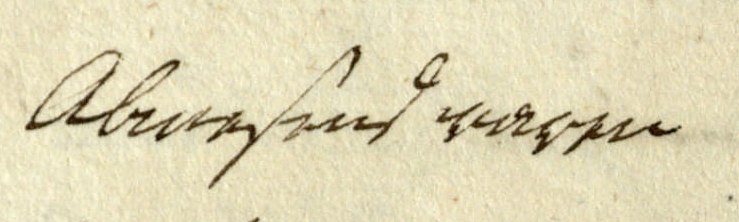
Abwesend waren
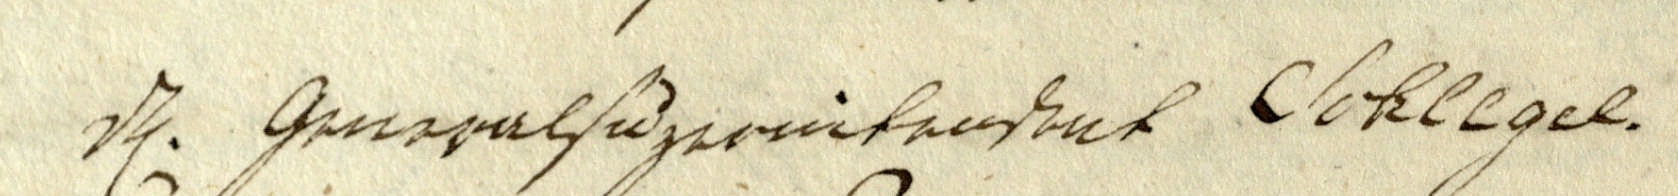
dh. Generalsuperintendent Schlegel.
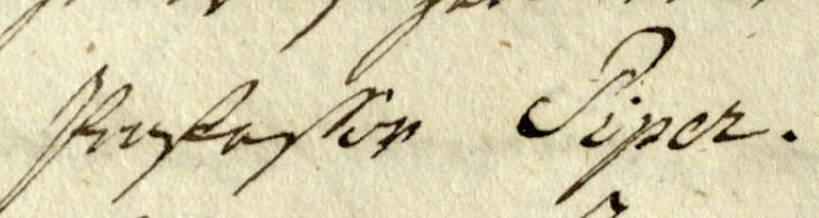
Professor Piper.
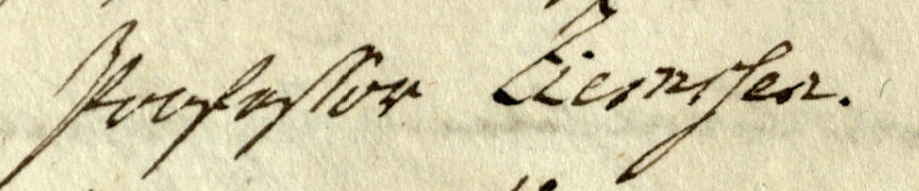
Professor Ziemssen.
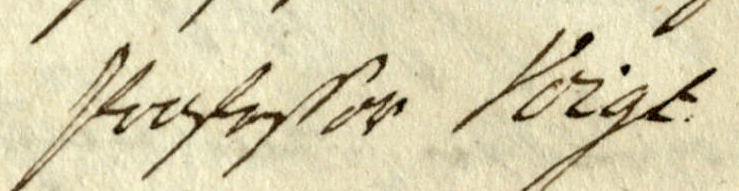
Professor Voigt.
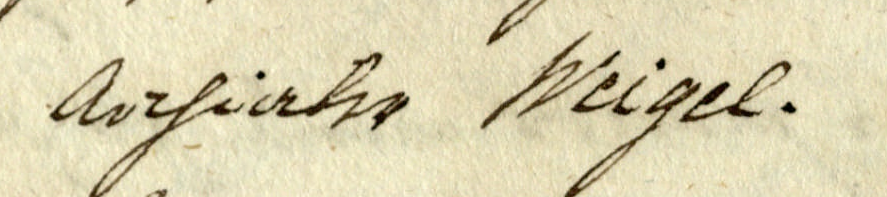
Archiater Weigel.
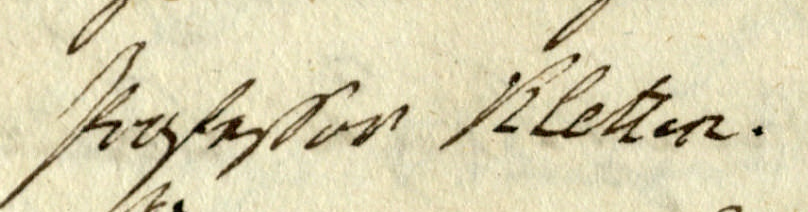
Professor Kletten.
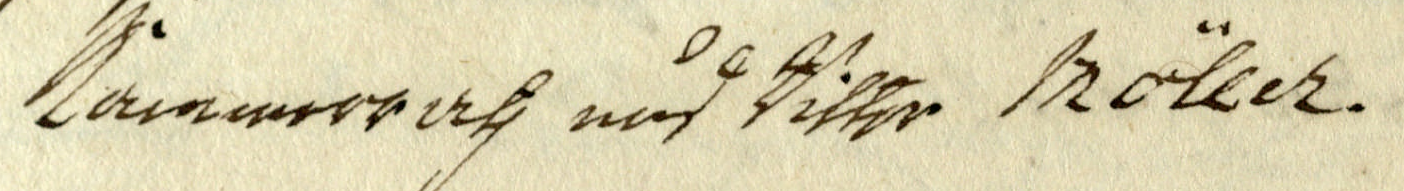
Kammerrath und Ritter Möller.
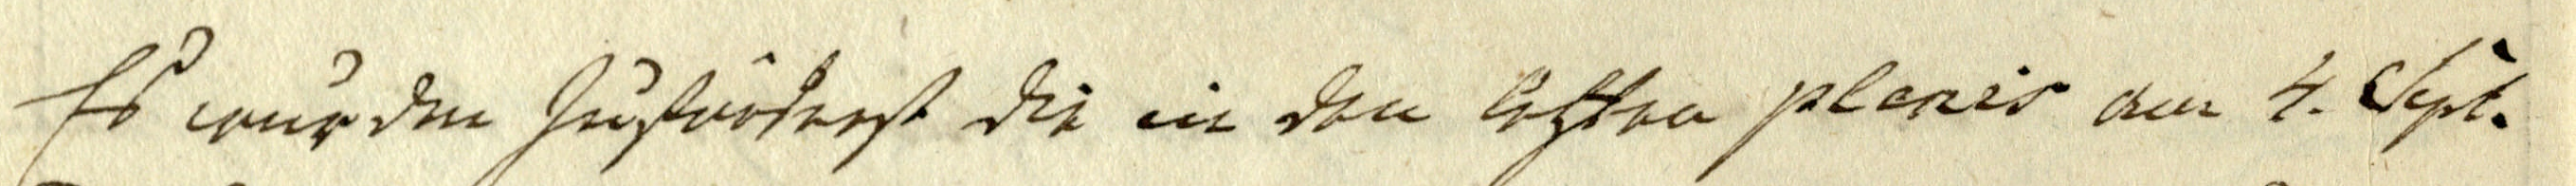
Es wurden zuförderst die in den letzten plenis am 4. Sept.
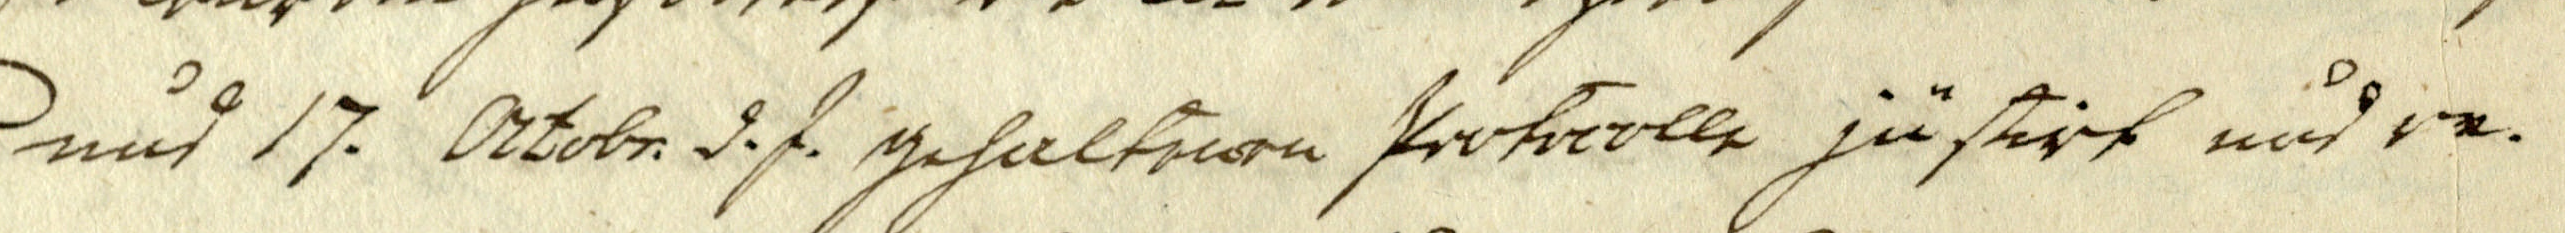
und 17. Octobr. d. J. gehaltenen Protocolle jüstirt und re¬
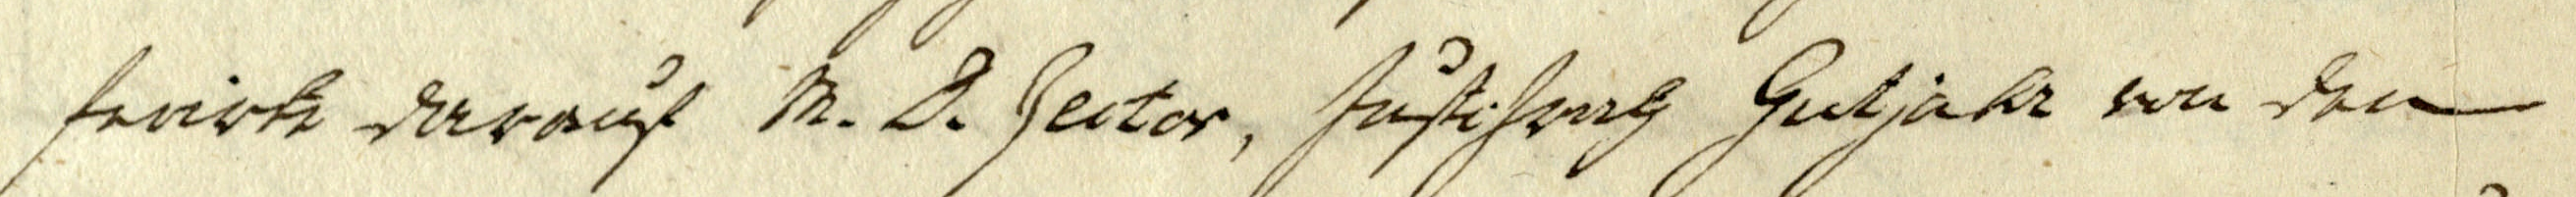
ferirte darauf M. D. Rector, Justizrath Gutjahr von den
